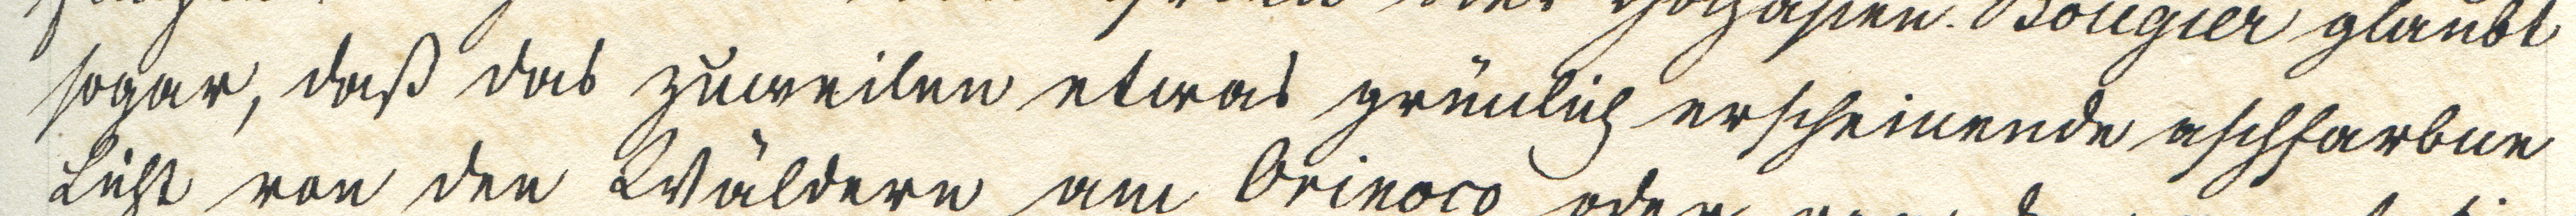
sogar, daß das zuweilen etwas grünlich erscheinende aschfarbne
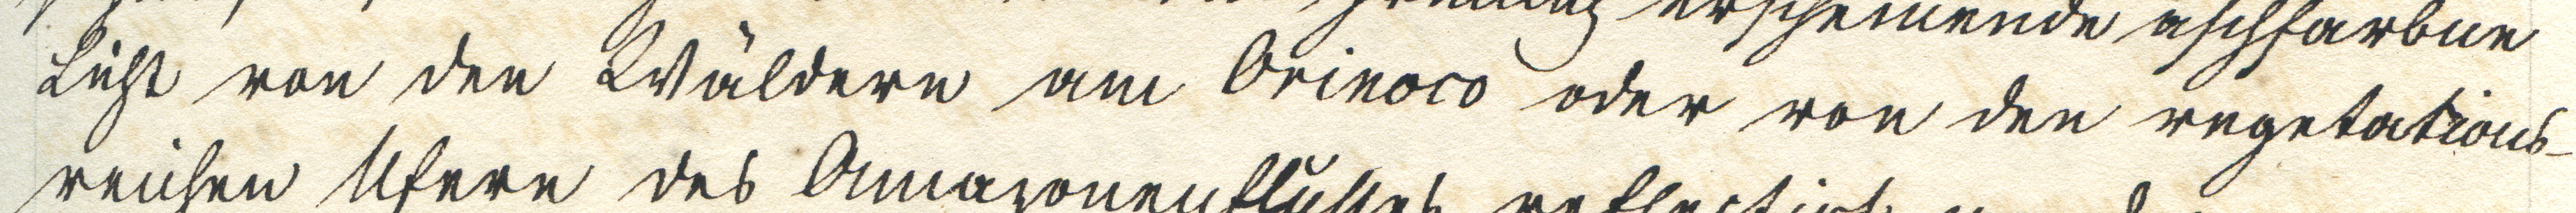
Licht von den Wäldern am Orinoco oder von den vegetations-
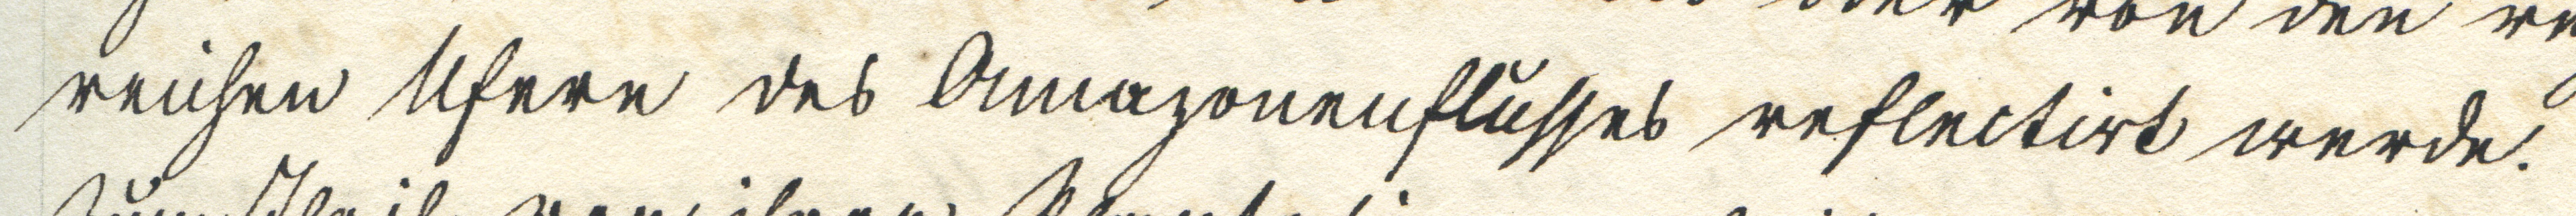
reichen Ufern des Amazonenflusses reflectirt wurde.
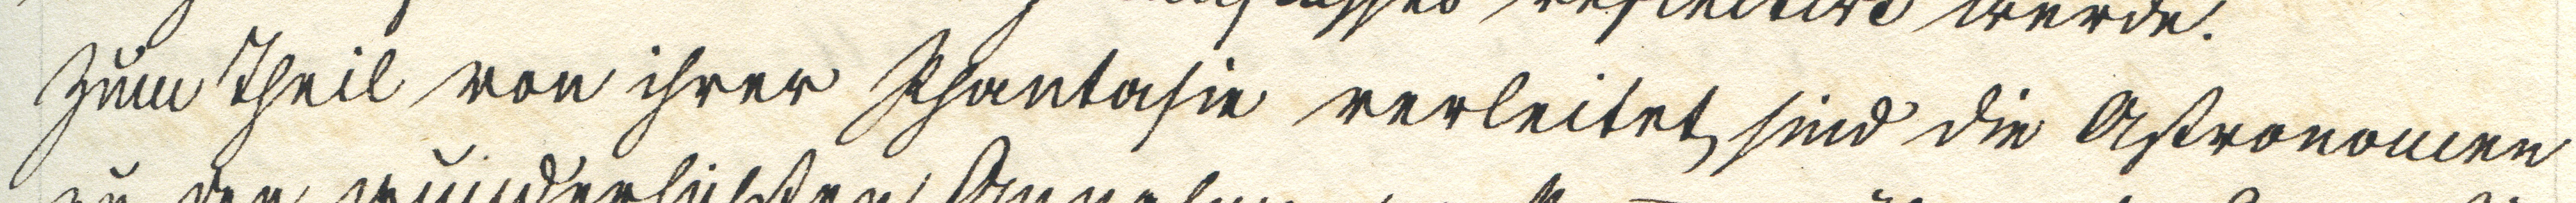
Zum Theil von ihrer Phantasie verleitet, sind die Astronomen
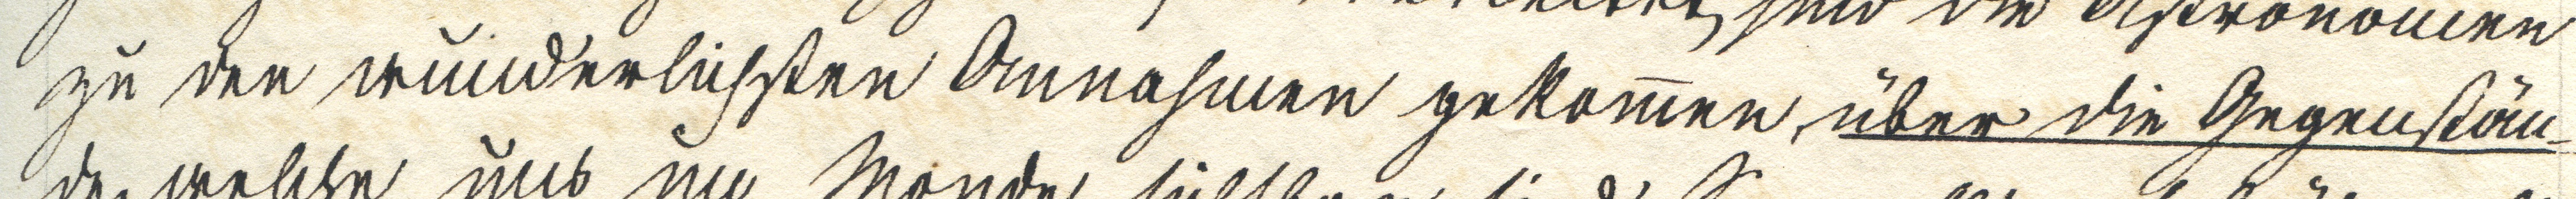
zu den wunderlichsten Annahmen gekom̃en, über die Gegenstän-
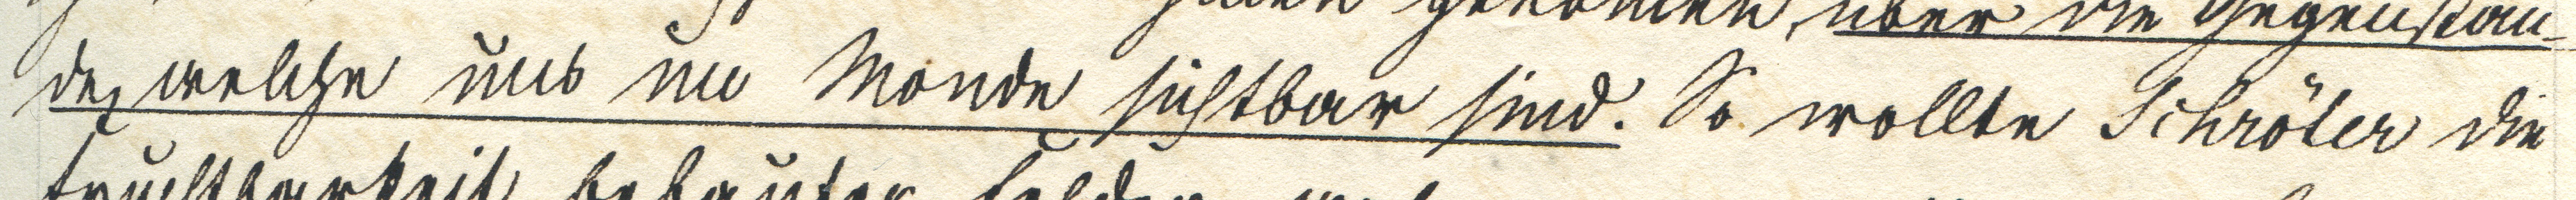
de, welche uns im Monde sichtbar sind. So wollte Schröter die
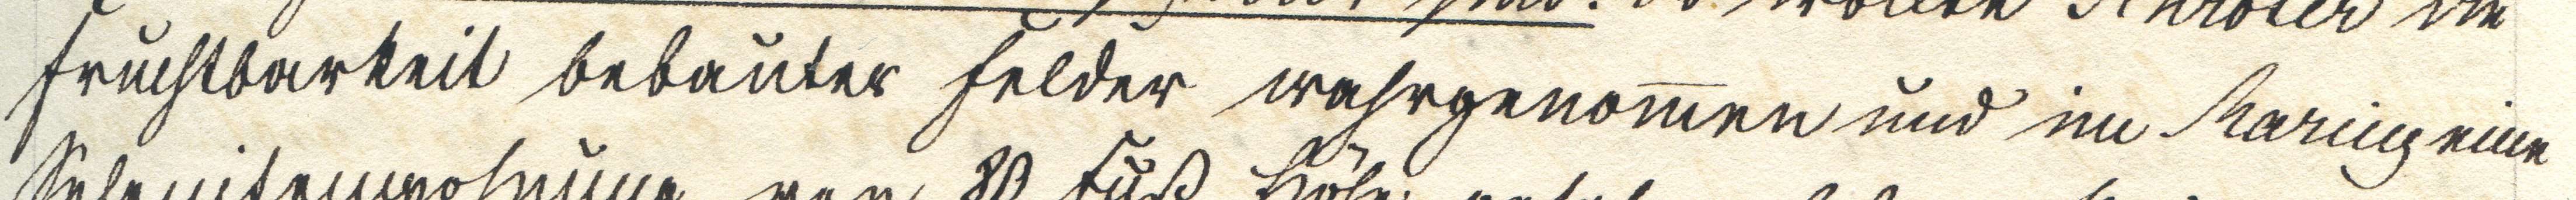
Fruchtbarkeit bebauter Felder wahrgenom̃en und im Marius eine
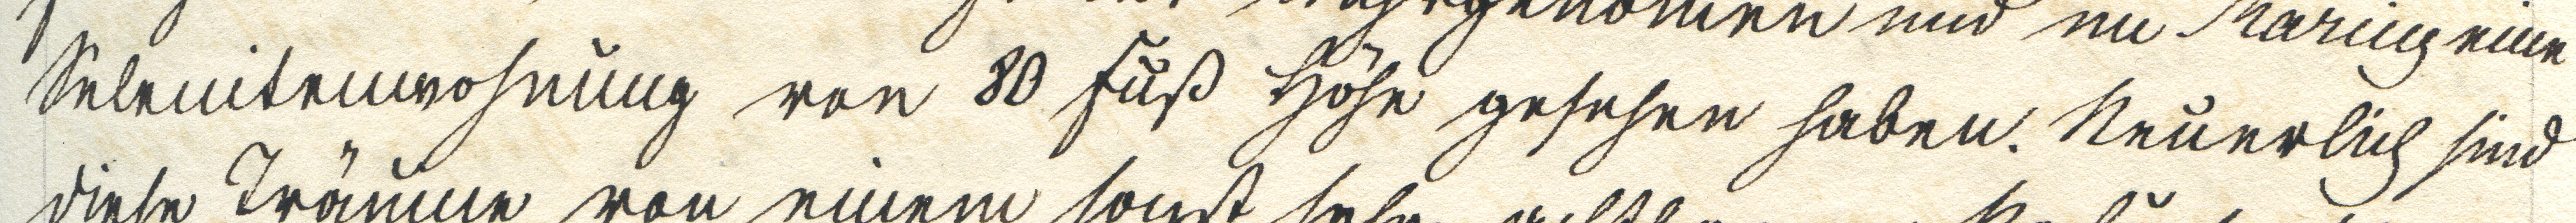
Selenitenwohnung von 80 Fuß Höhe gesehen haben. Neuerlich sind
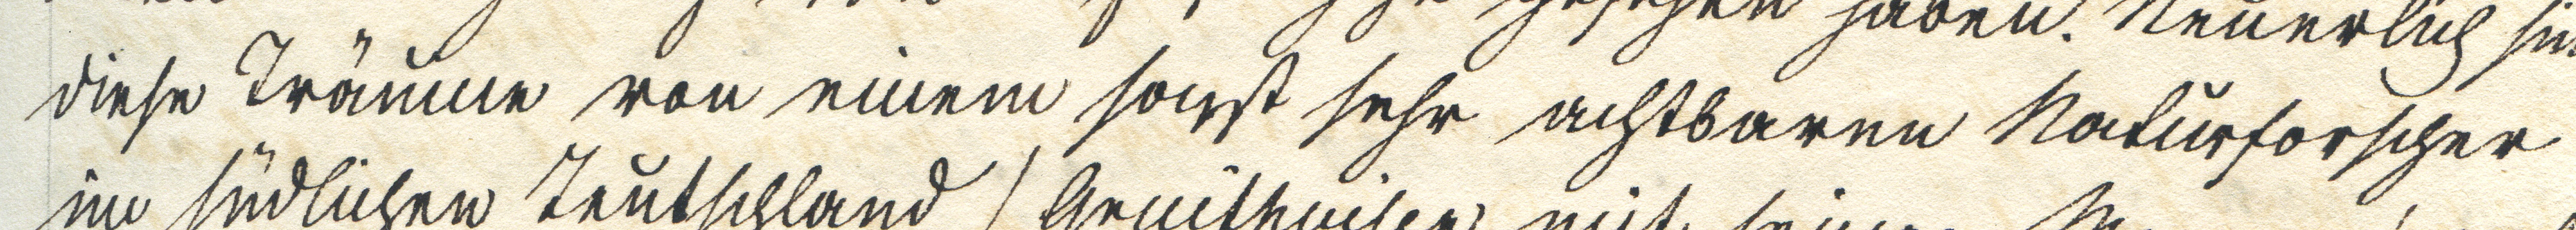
diese Träume von einem sonst sehr achtbaren Naturforscher
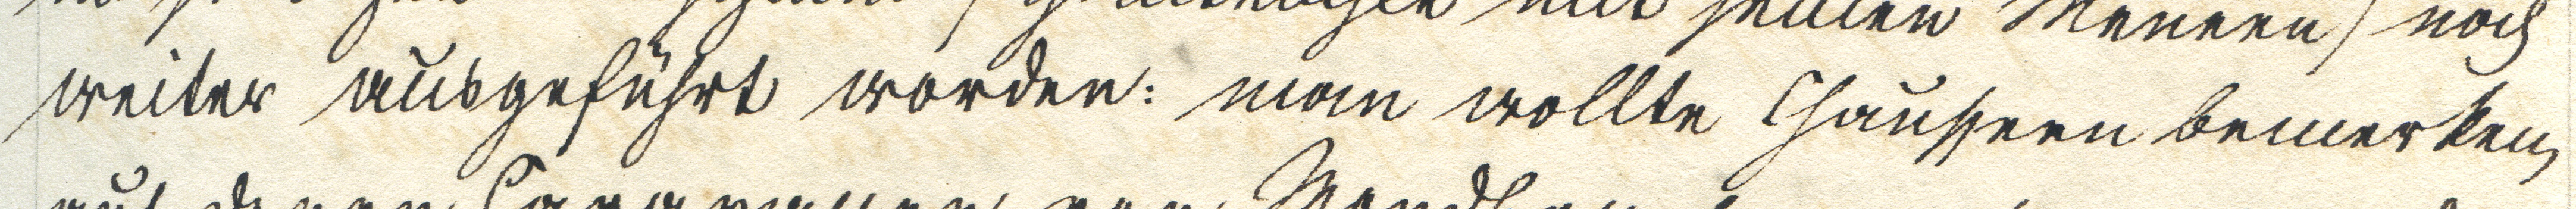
weiter ausgeführt worden: man wollte Chausseen bemerken,
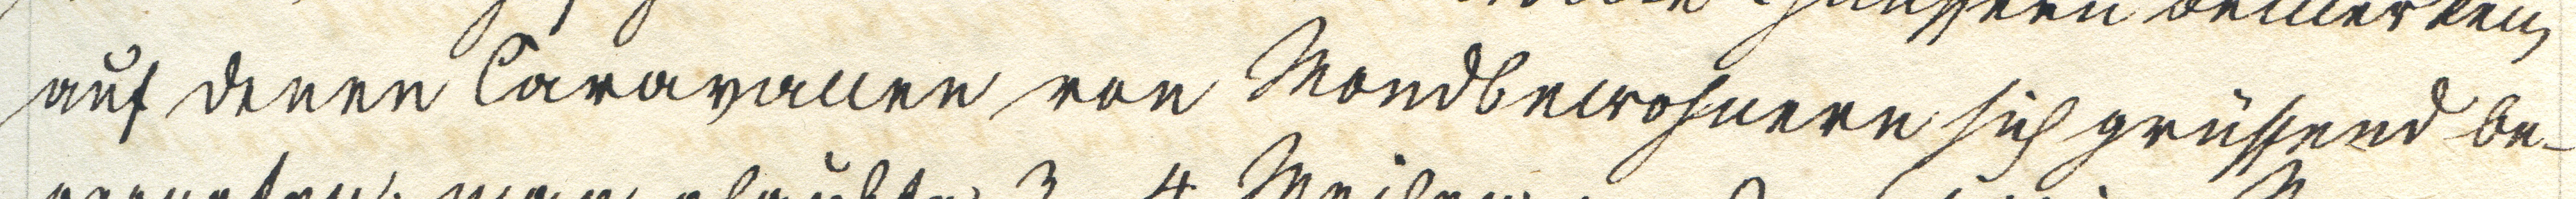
auf denen Caravanen von Mondbewohnern sich grüssend be-
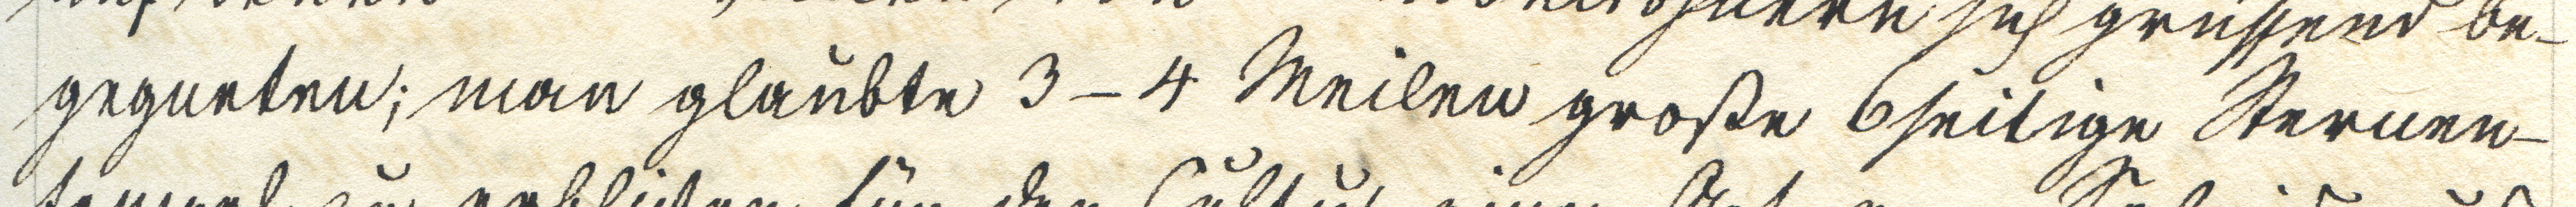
gegneten; man glaubte 3–4 Meilen große 6seitige Sternen-
